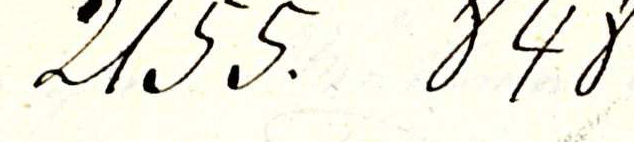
2155 848
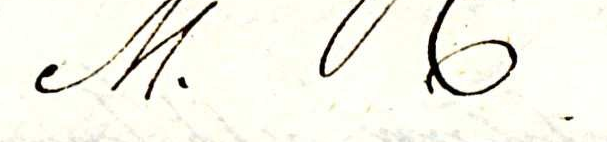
MR
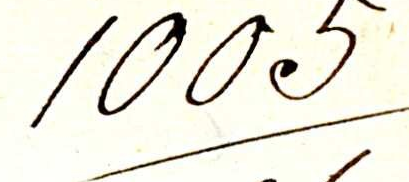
1005
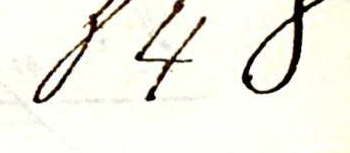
848
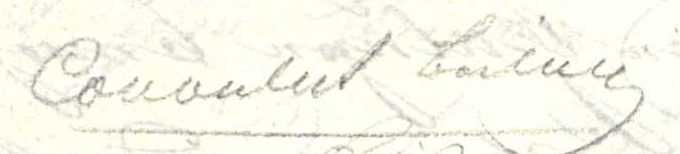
Convalut Beluuin
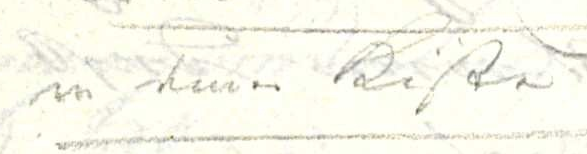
in dien Riße
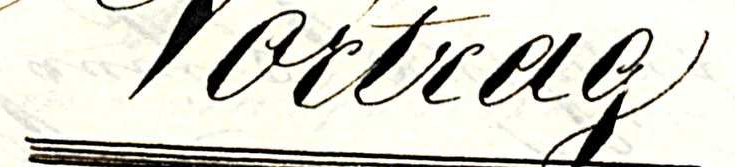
Vortrag
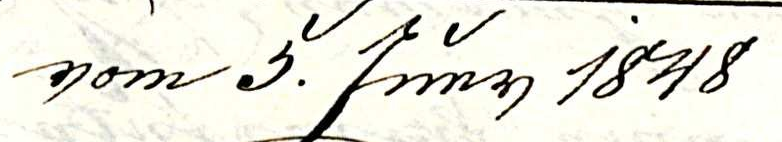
vom 5. Juny 1848
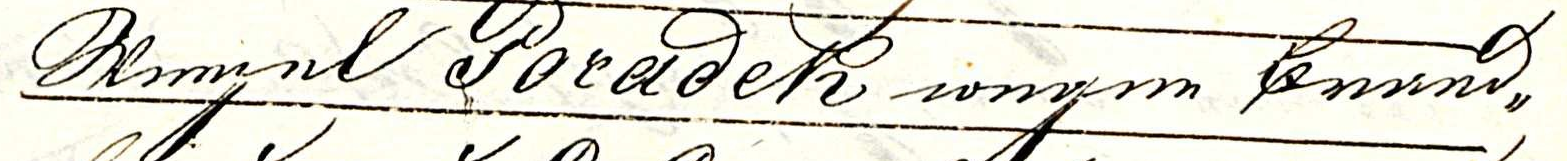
Wenzel Poradek wegen Brand¬
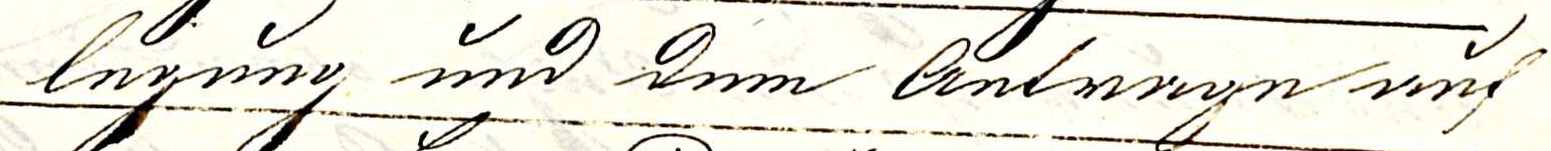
legung und dem Antrage auf
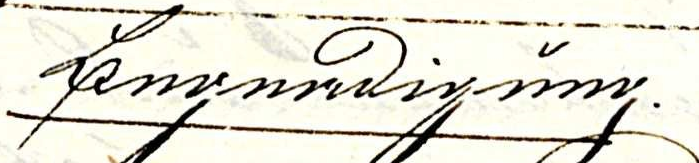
Begnadigung
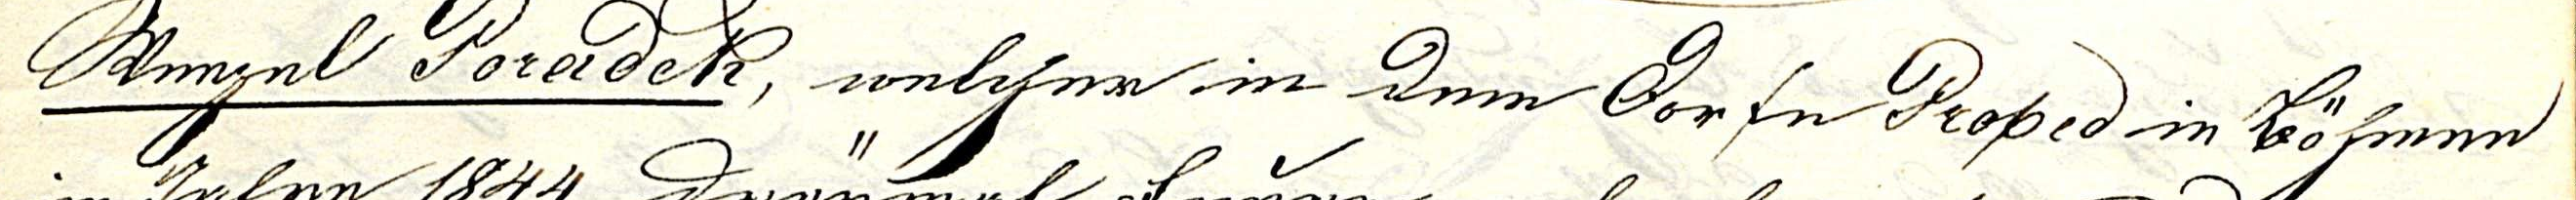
Wenzel Poradek, welcher in dem Dorfe Proped in Böhmen
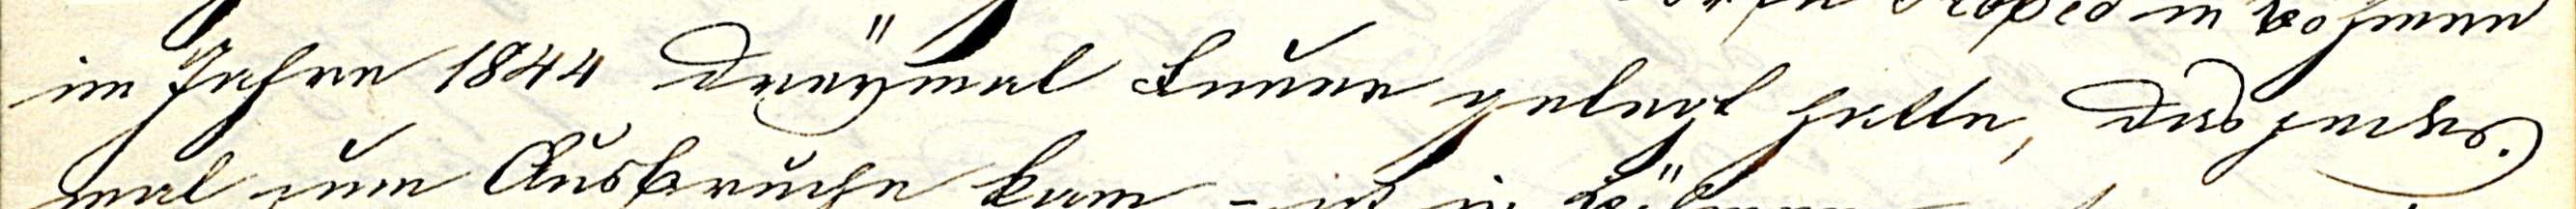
im Jahre 1844 dreymal Feuer gelegt hatte, das jades
